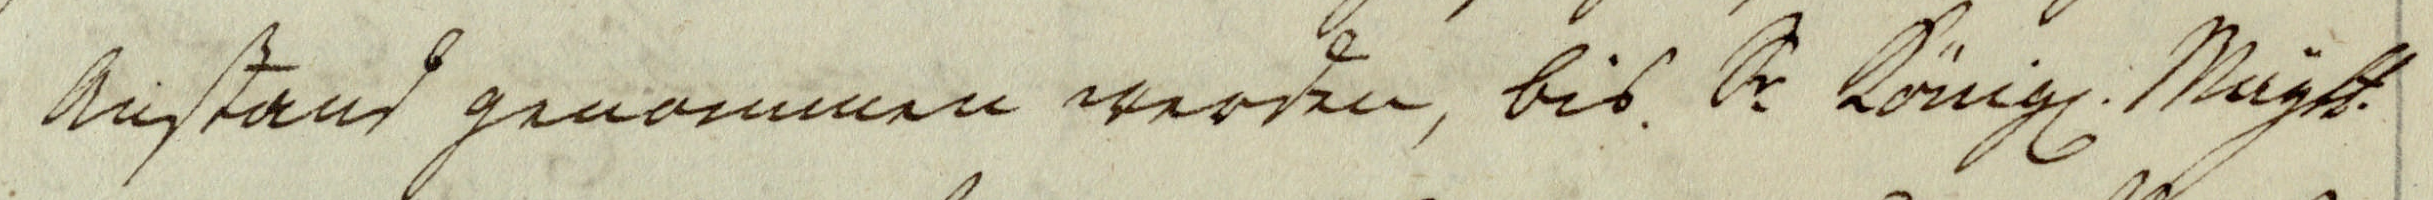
Anstand genommen werden, bis Sr. Königl. Maÿst.
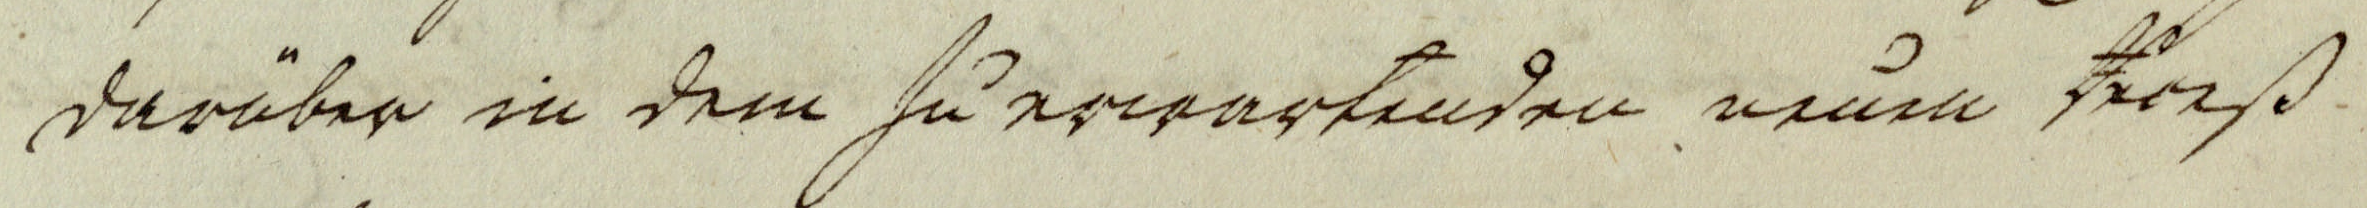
darüber in dem zu erwartenden neuen Receß
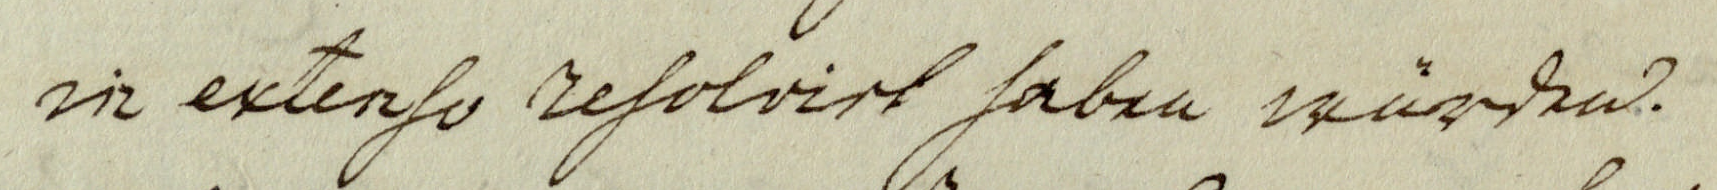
in extenso resolvirt haben würden.
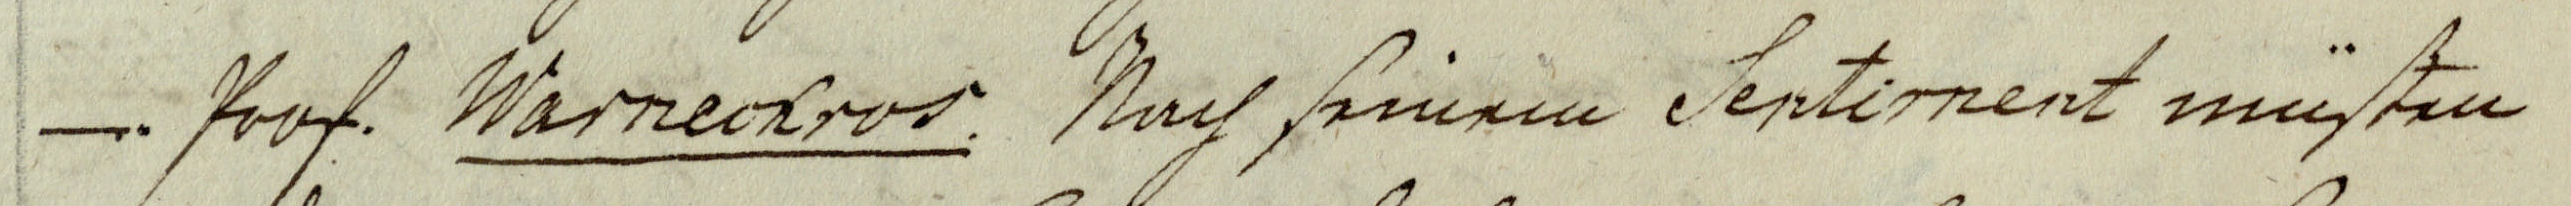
— . Prof. Warneckros. Nach seinem Sentiment müssten
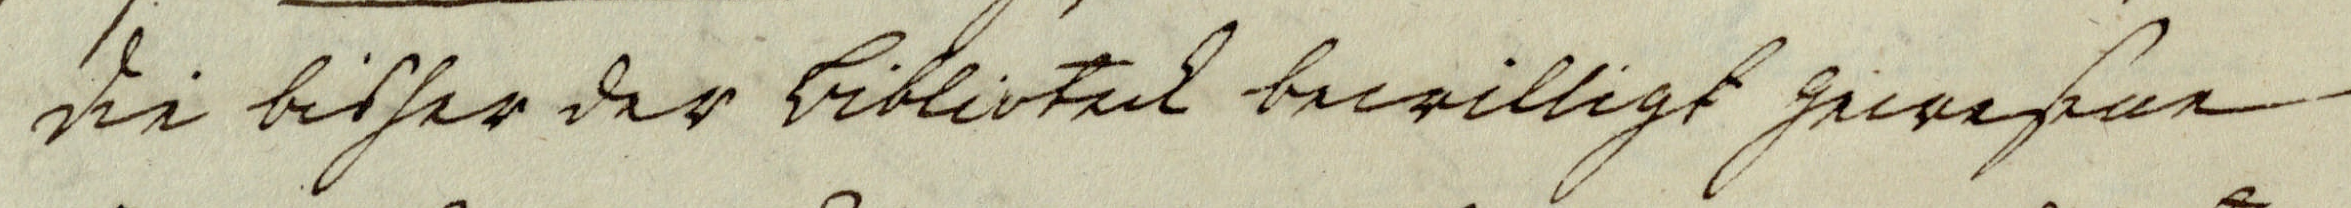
die bisher der Bibliotek bewilligt gewesenen
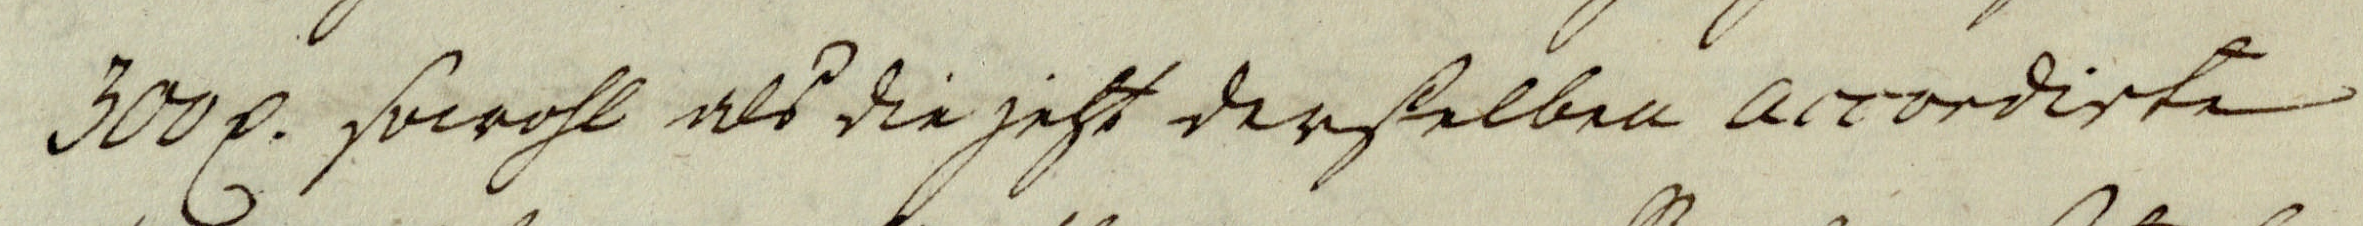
300 rtl. sowohl als die jetzt derselben accordirten
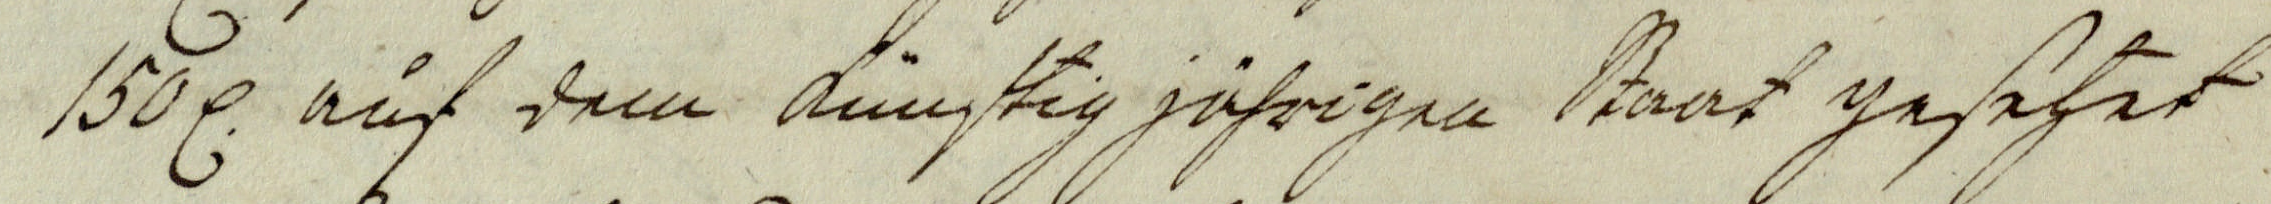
150 rtl. auf dem künftig jährigen Staat gesetzet
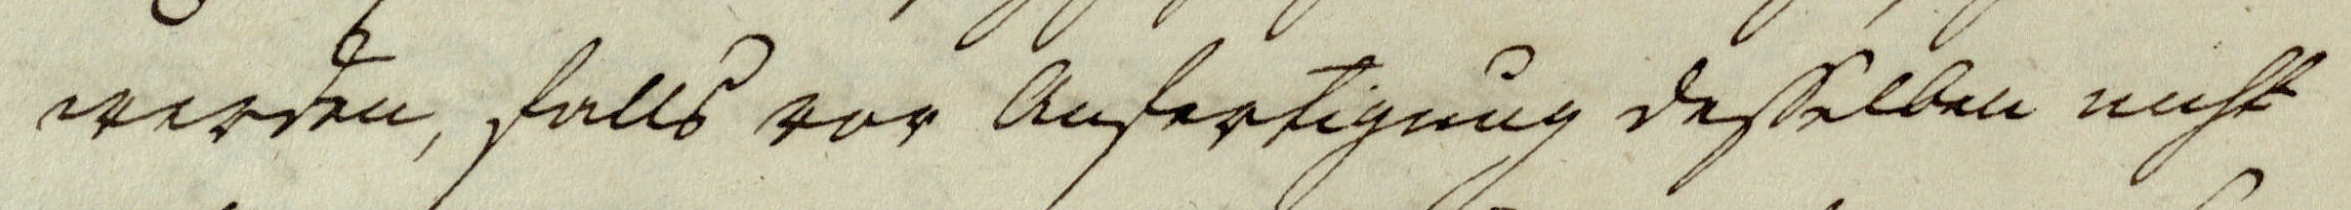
werden, falls vor Anfertigung desselben nicht
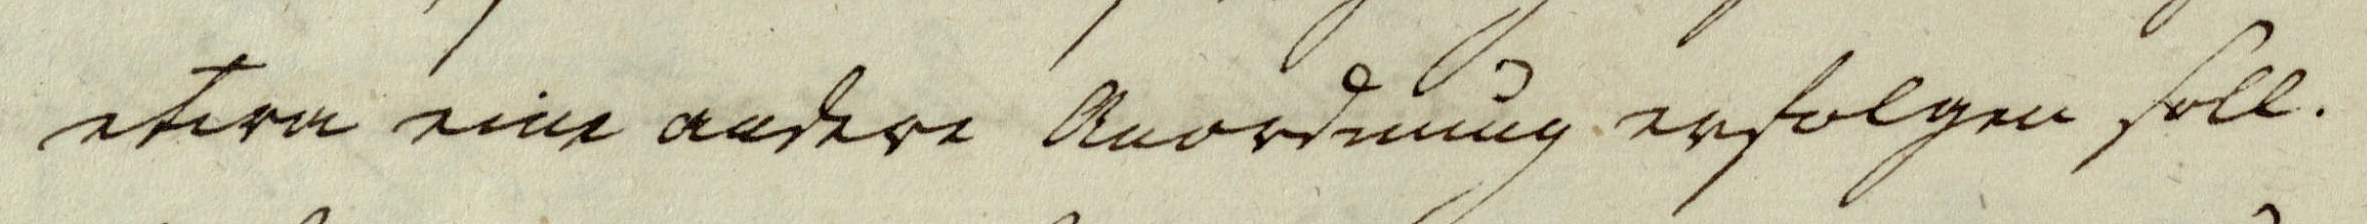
etwa eine andere Anordnung erfolgen soll¬
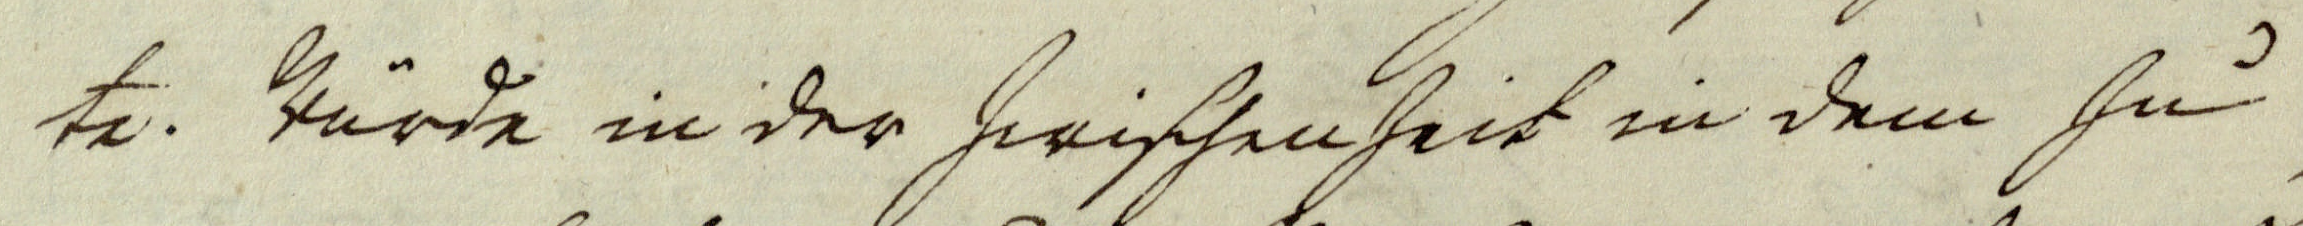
te. Würde in der Zwischenzeit in dem zu
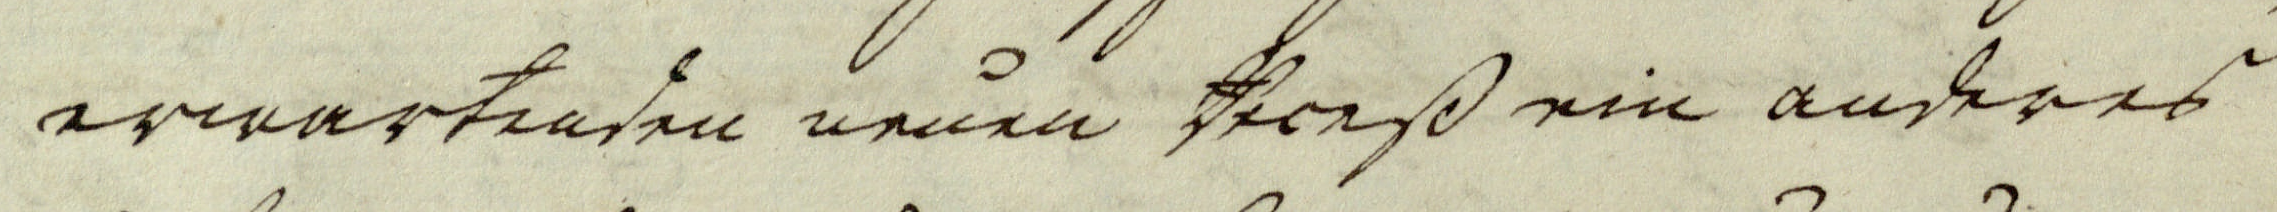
erwartenden neuen Receß ein anderes
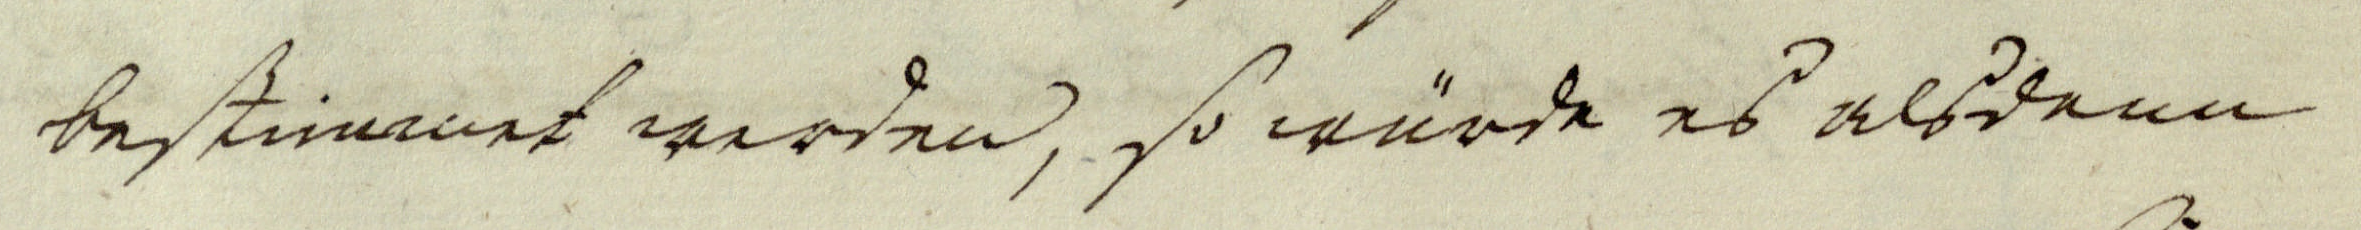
bestimmet werden, so würde es alsdann
